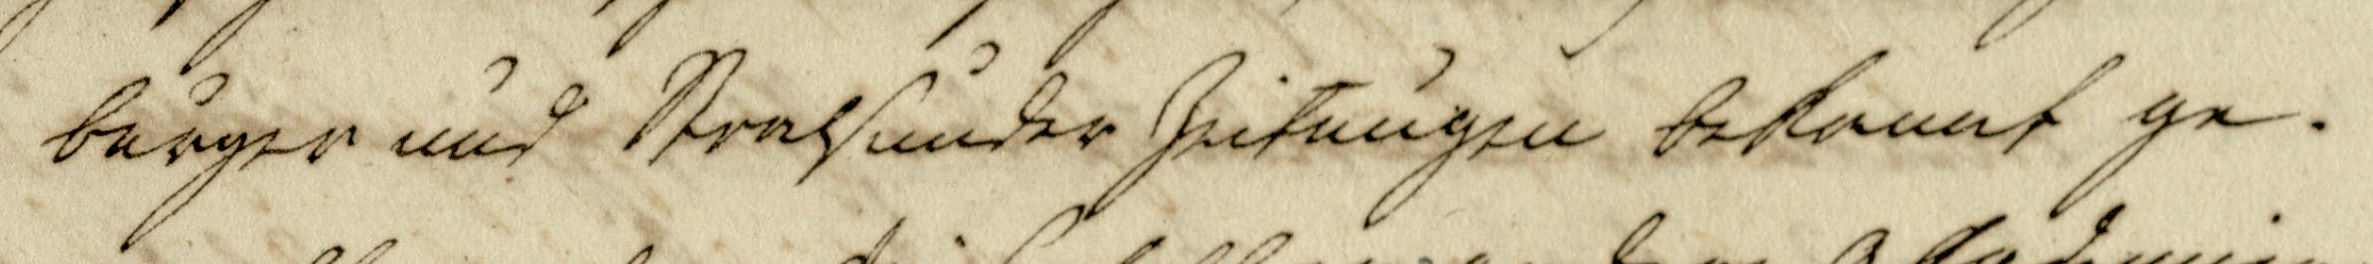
burger und Stralsunder Zeitungen bekannt ge¬
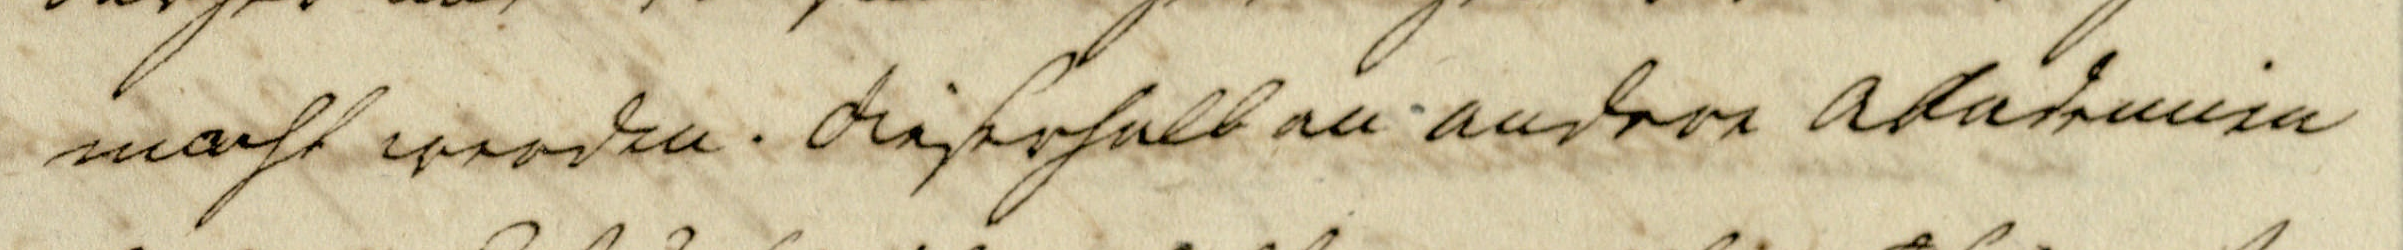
macht werden. Dieserhalb an andere Akademien
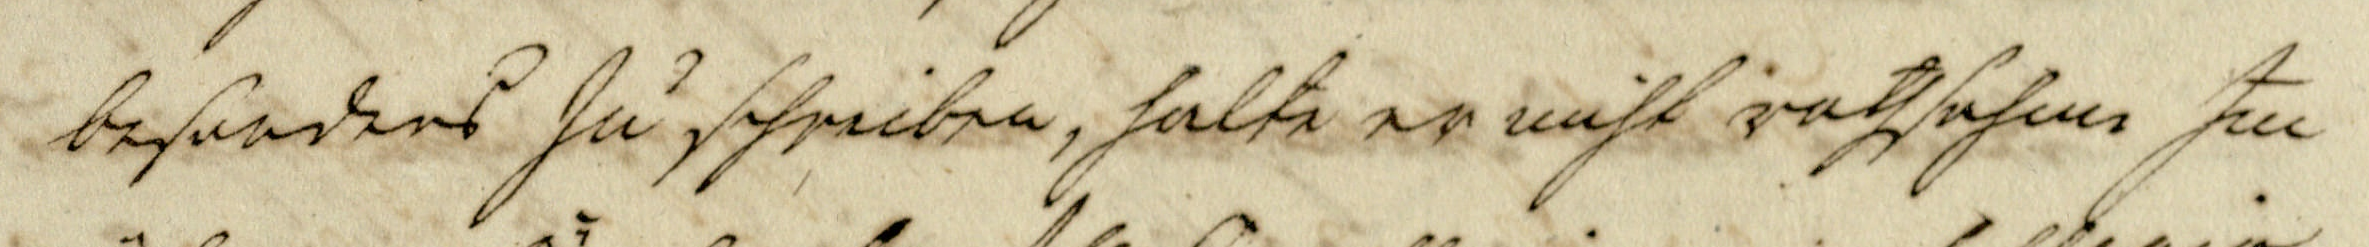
besonders zu schreiben, halte er nicht rathsahm. Im
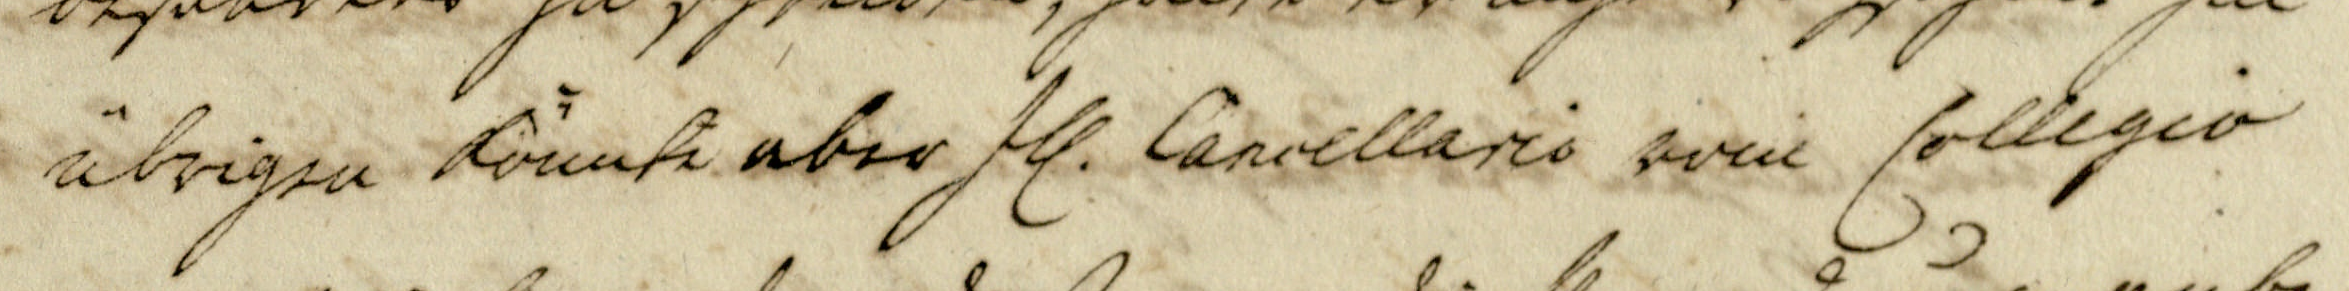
übrigen könnte aber Ill. Cancellario vom Collegio
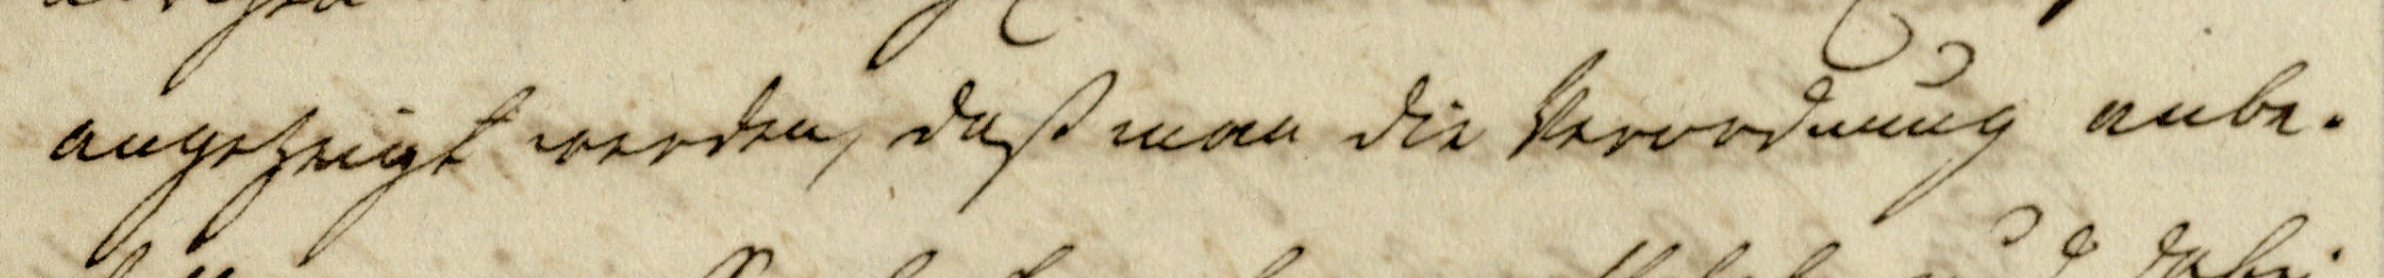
angezeigt werden, daß man die Verordnung anbe¬
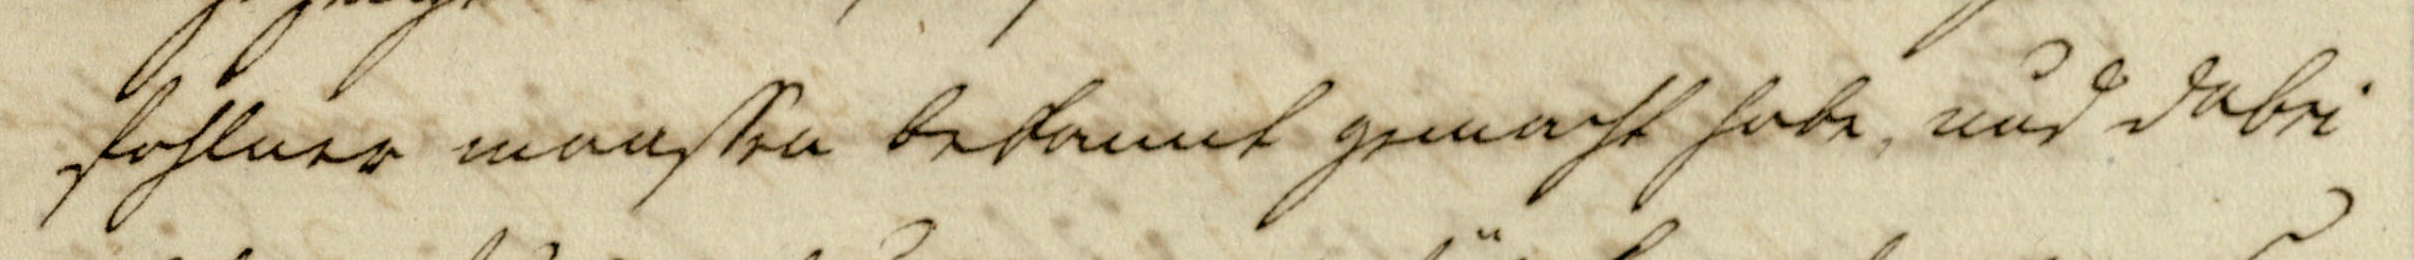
fohlner maassen bekannt gemacht habe, und dabei
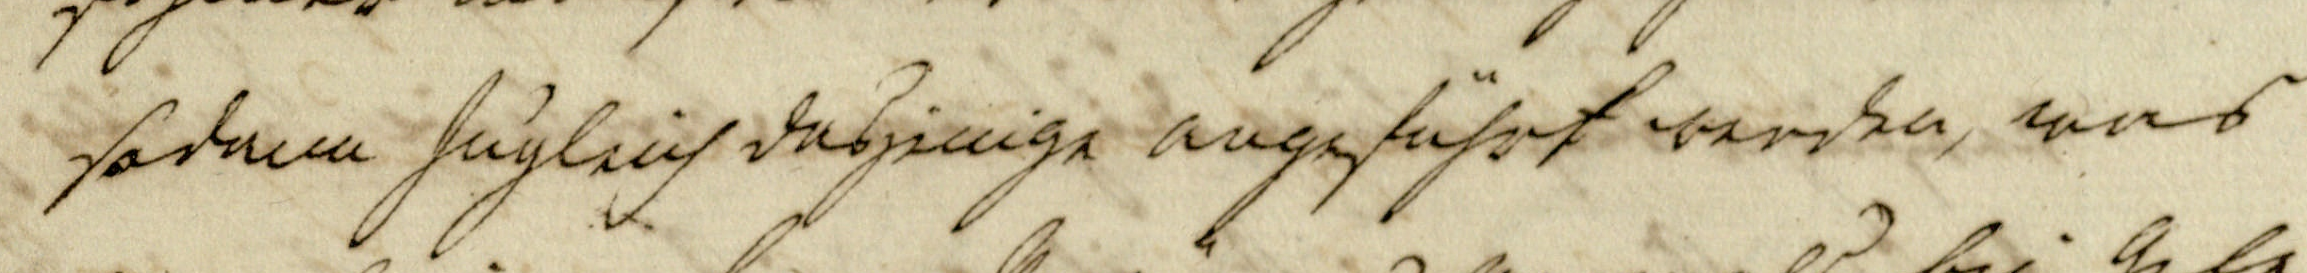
sodann zugleich dasjenige angeführt werden, was
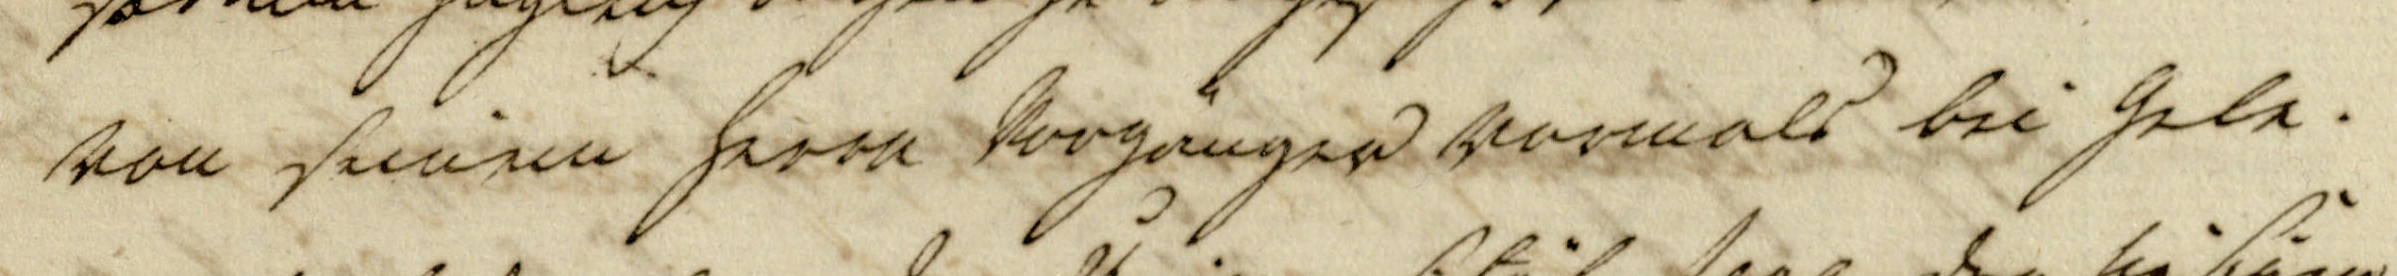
von seinem Herrn Vorgänger vormals bei Gele¬
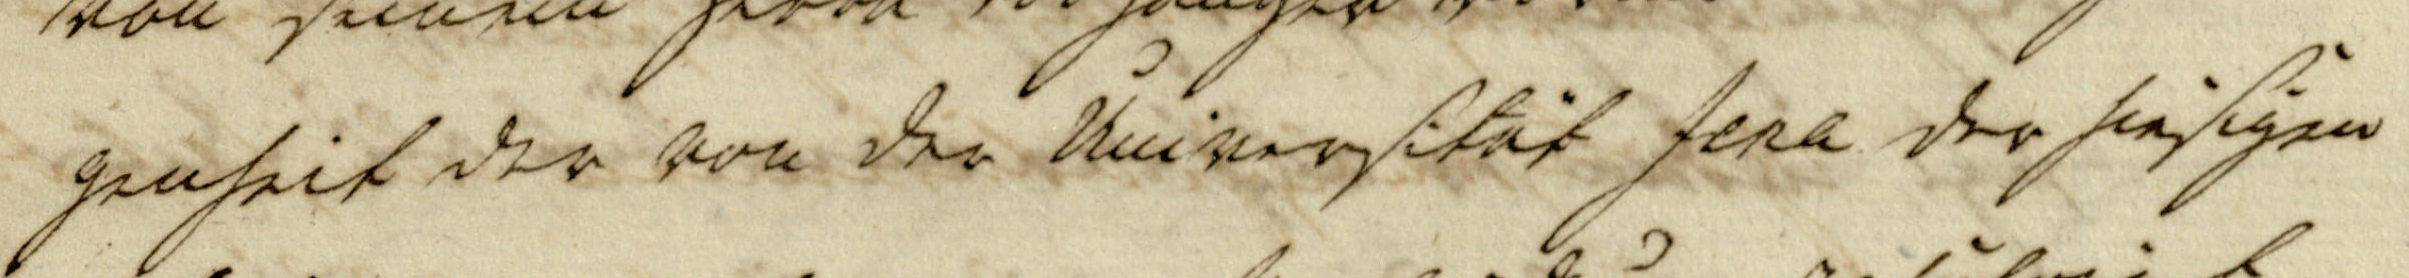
genheit der von der Universität Jena der hiesigen
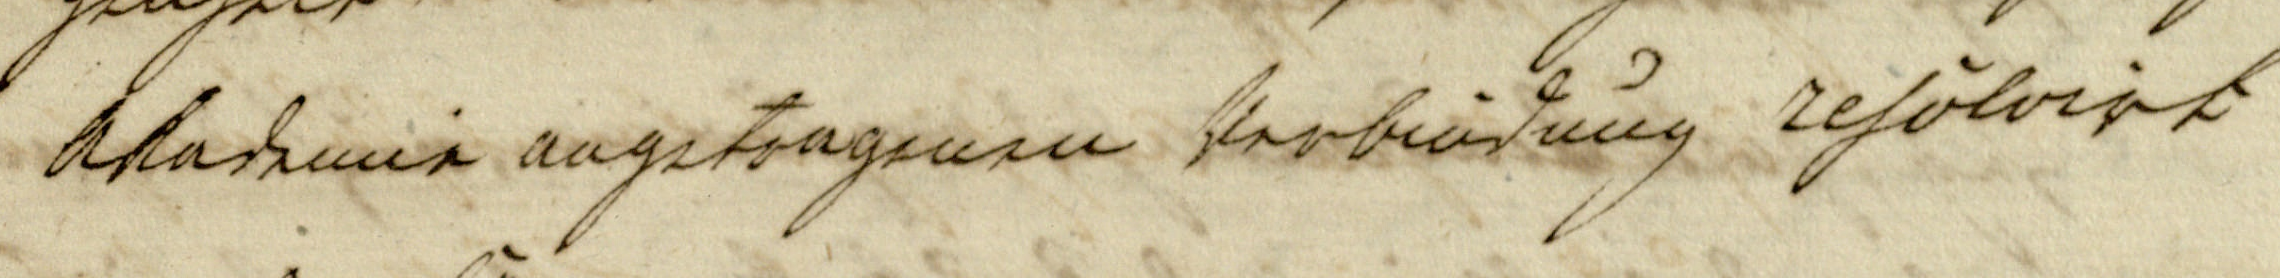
Akademie angetragenen Verbindung resolvirt
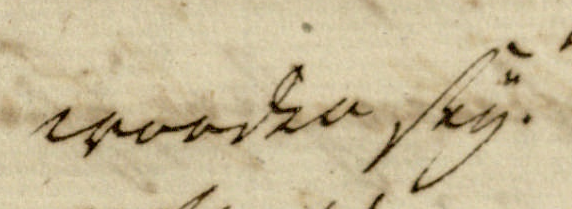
worden seÿ.
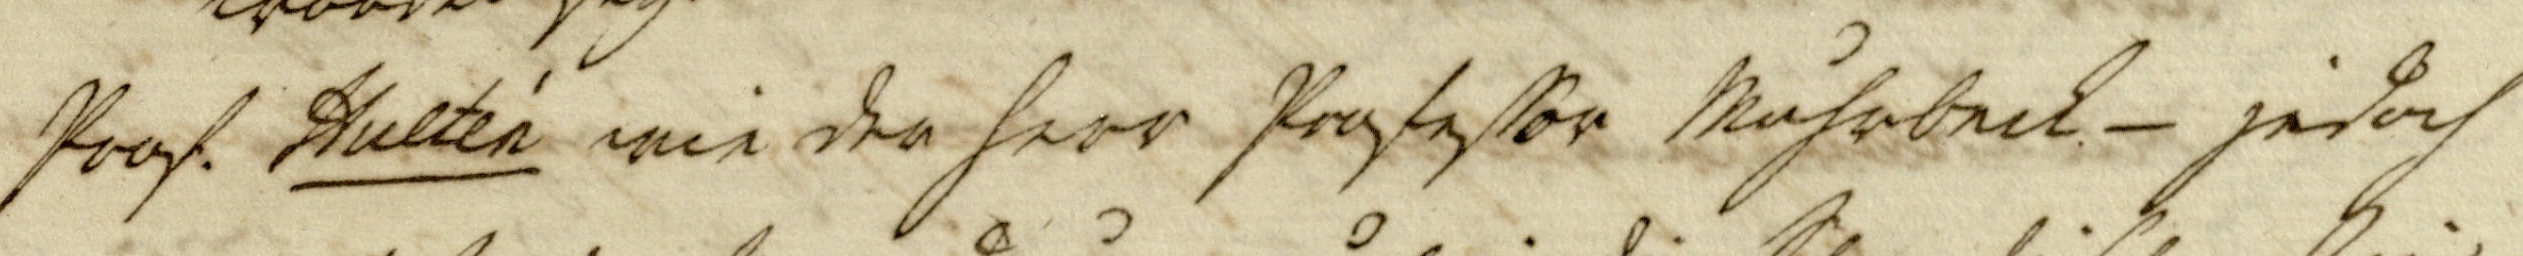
Prof. Hultén wie der Herr Professor Muhrbeck jedoch
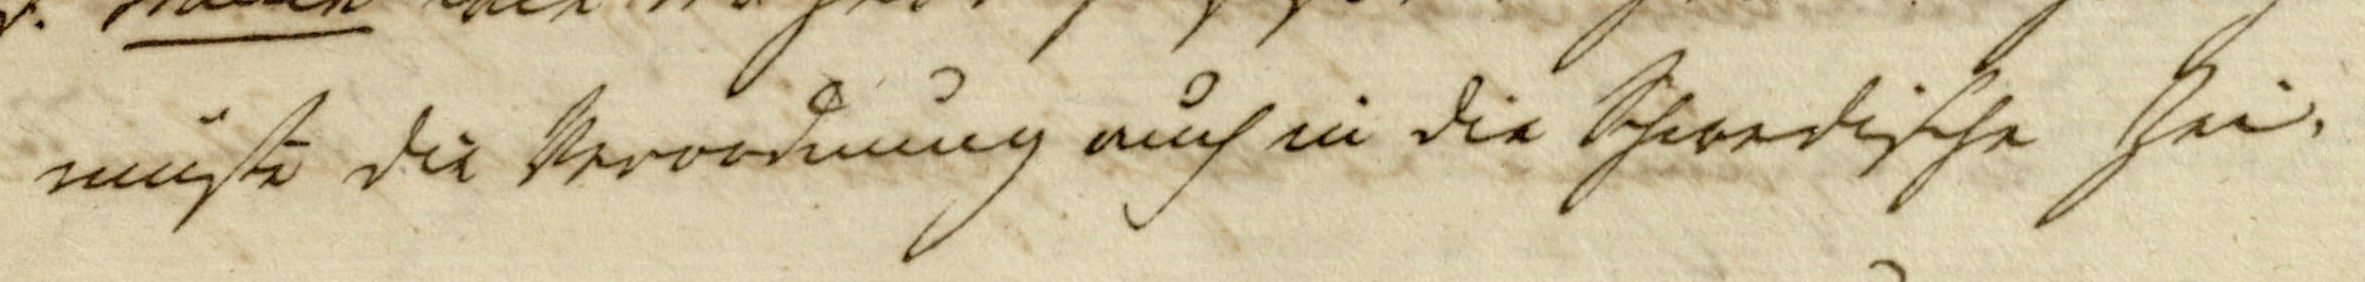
müßte die Verordnung auch in die Schwedische Zei¬
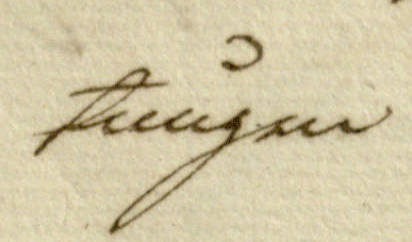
tungen
